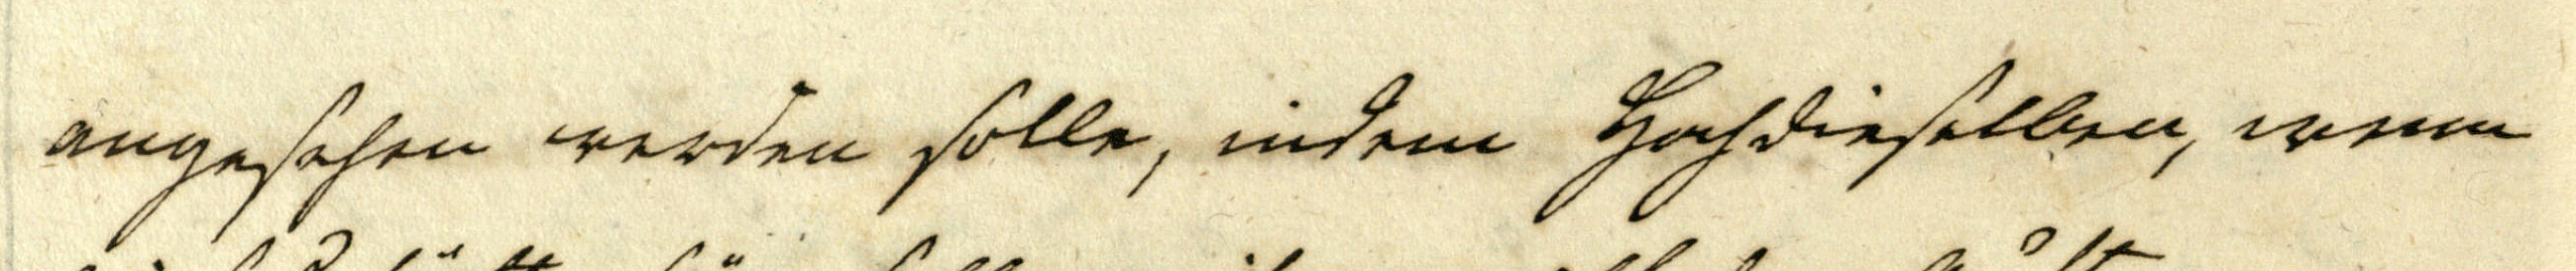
angesehen werden solle, indem Hochdieselben, wenn
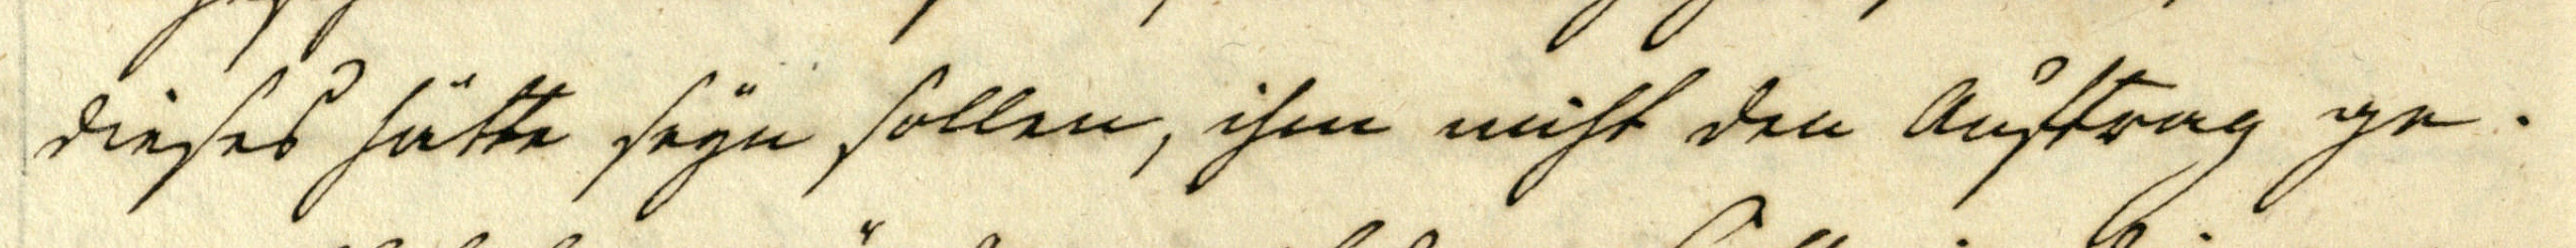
dieses hätte seÿn sollen, ihm nicht den Auftrag ge
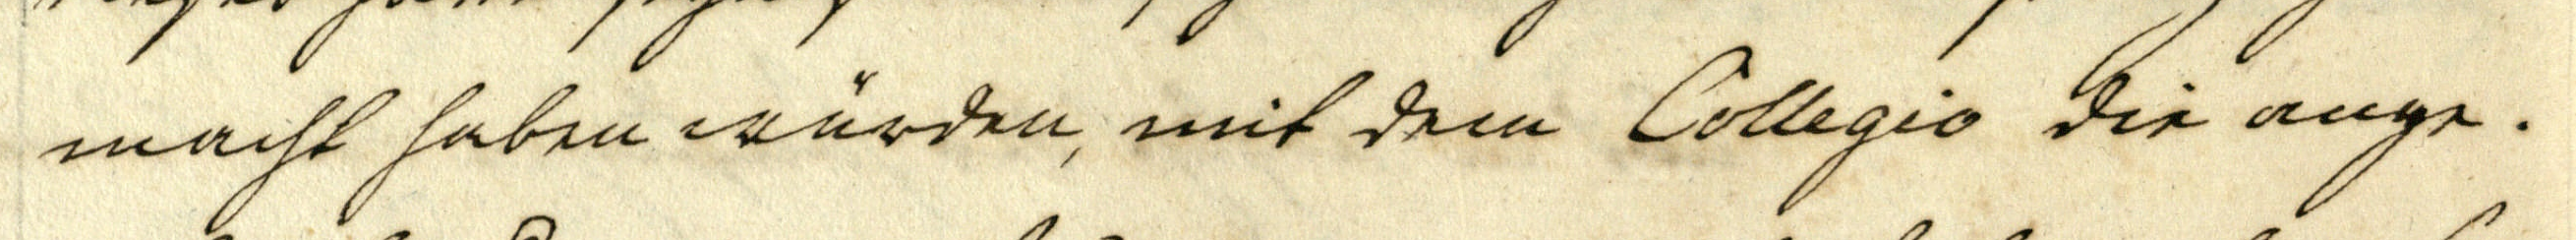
macht haben würden, mit dem Collegio die ange¬
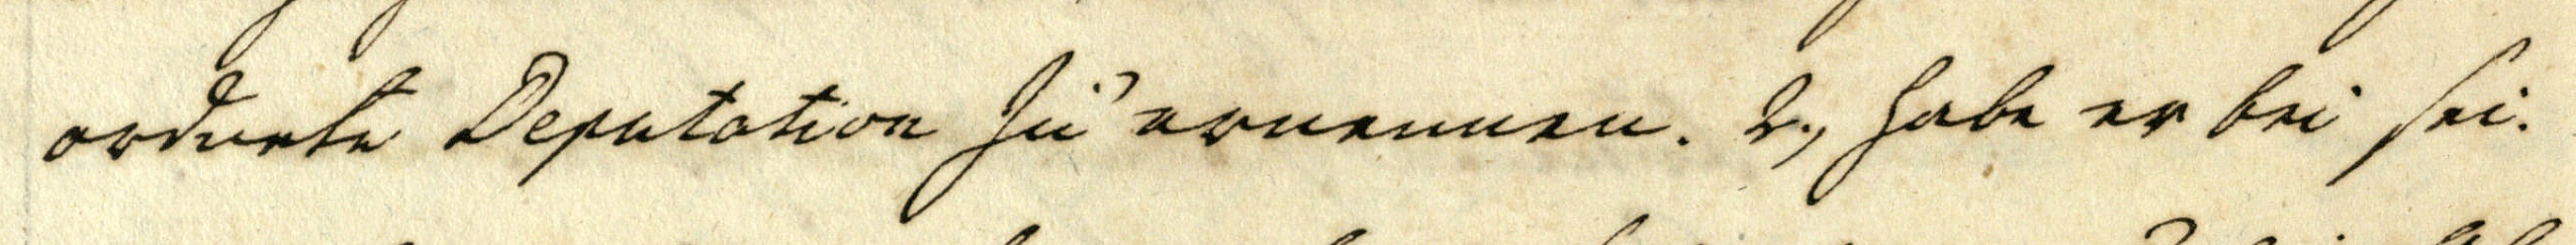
ordnete Deputation zu ernennen. 2, habe er bei sei¬
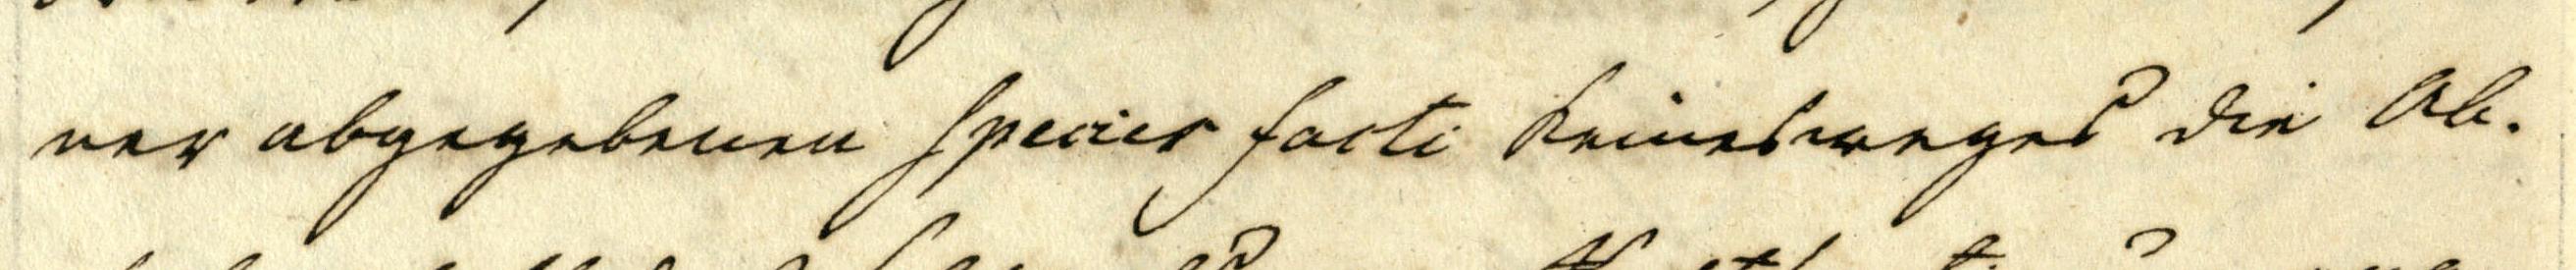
ner abgegebenen species facti keinesweges die Ab¬
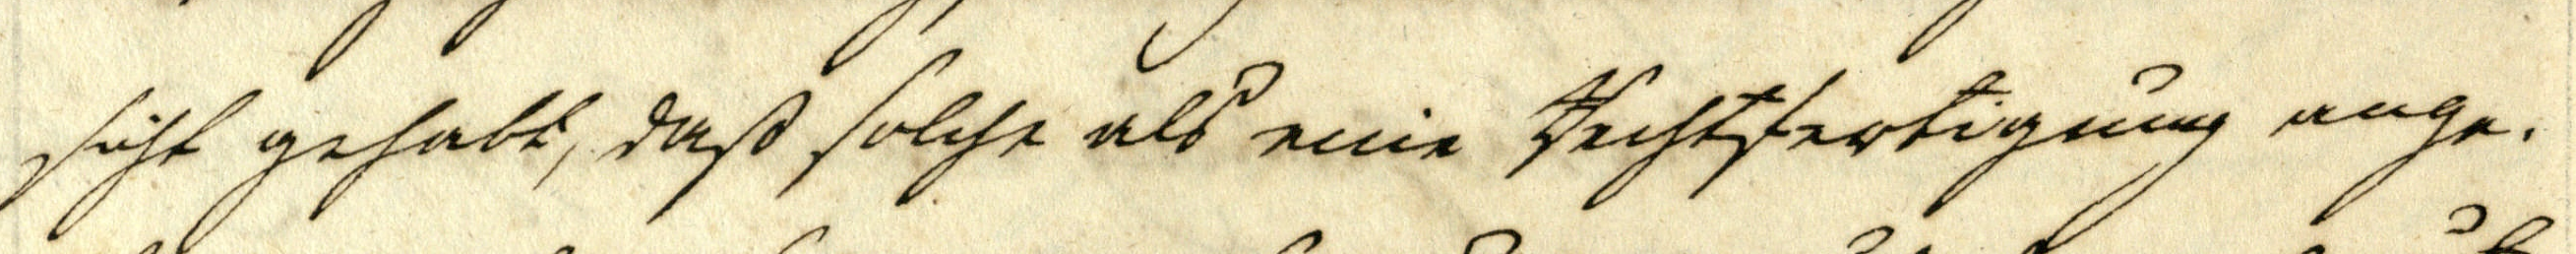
sicht gehabt, daß solche als eine Rechtfertigung ange¬
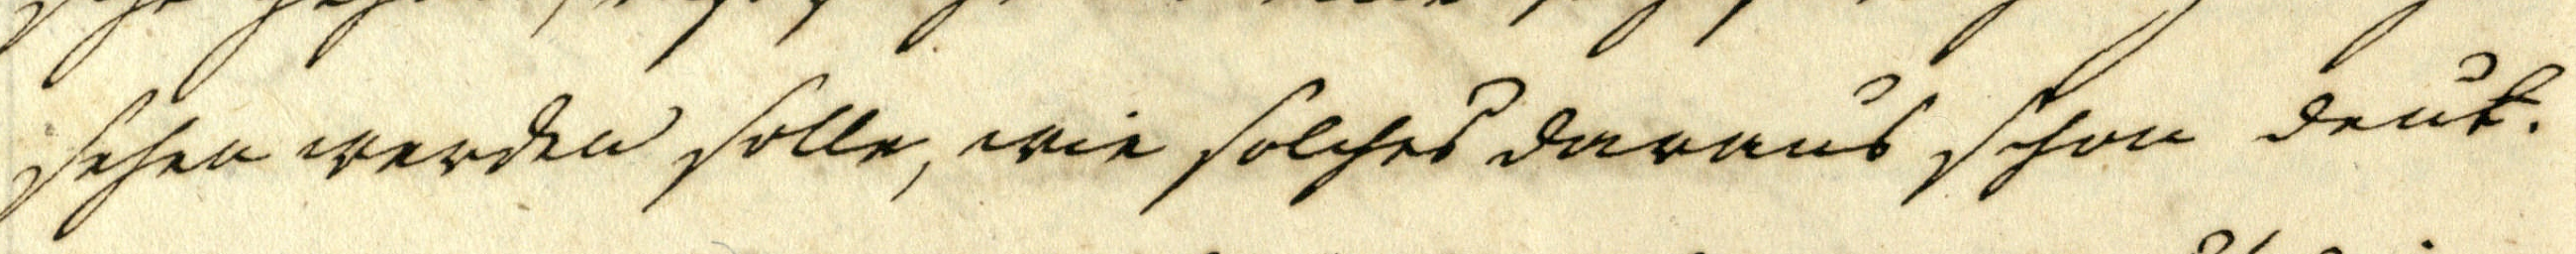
sehen werden solle, wie solches daraus schon deut¬
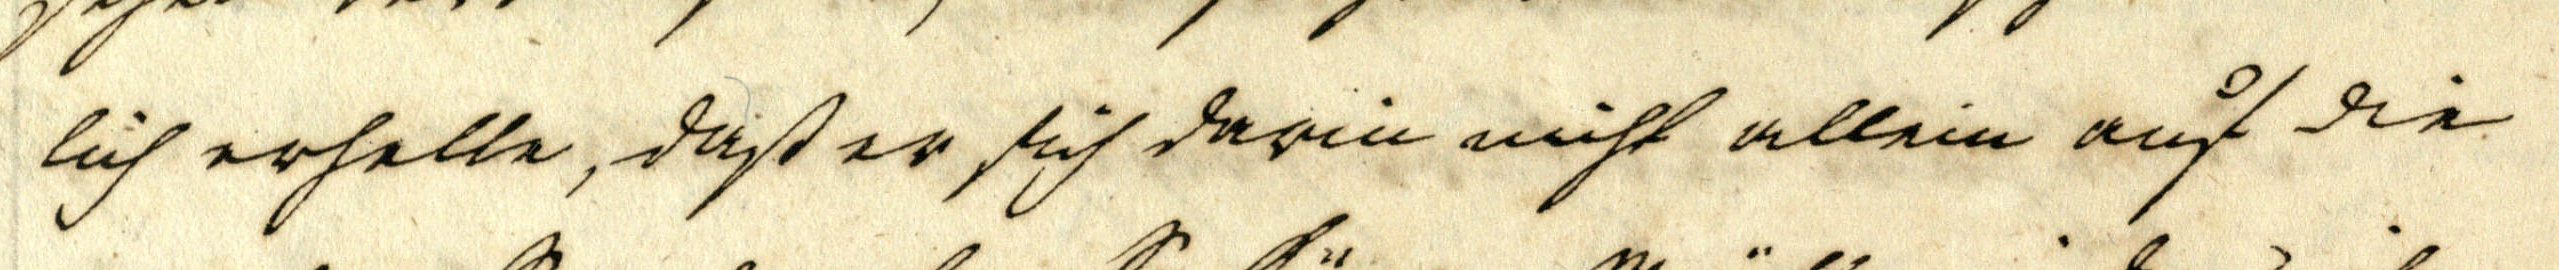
lich erhelle, daß er sich darin nicht allein auf die
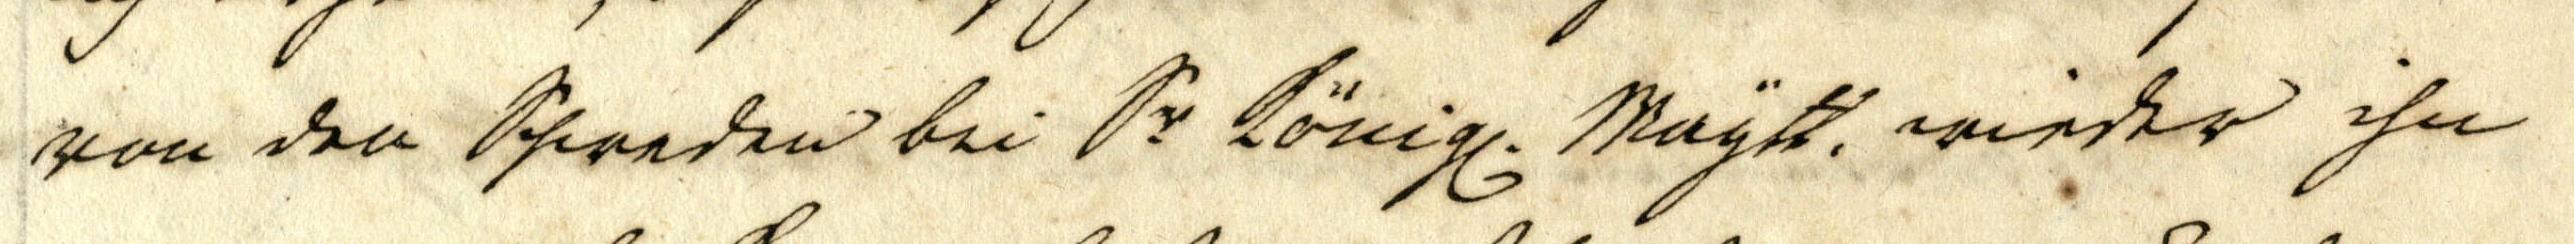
von den Schweden bei Sr Königl. Maÿtt. wieder ihn
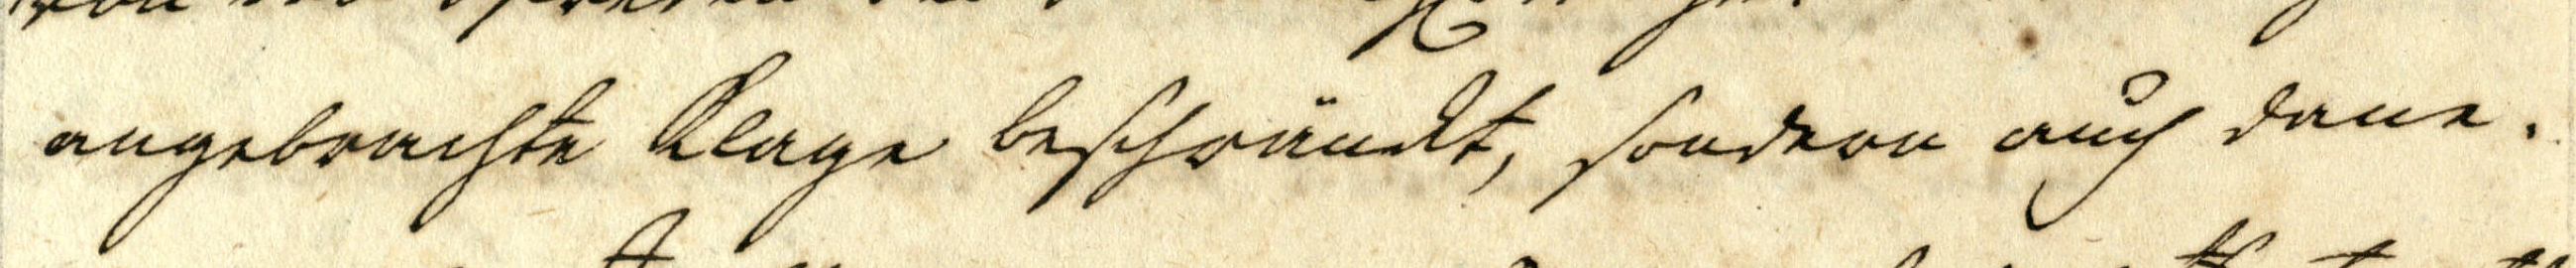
angebrachte Klage beschränckt, sondern auch dane¬
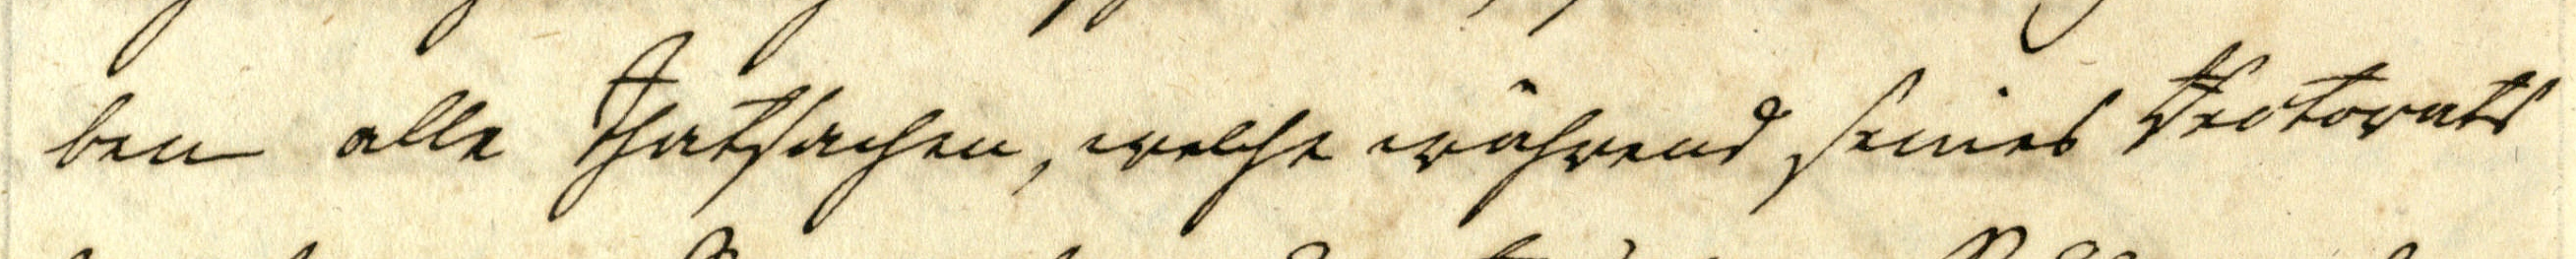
ben alle Thatsachen, welche während seines Rectorats
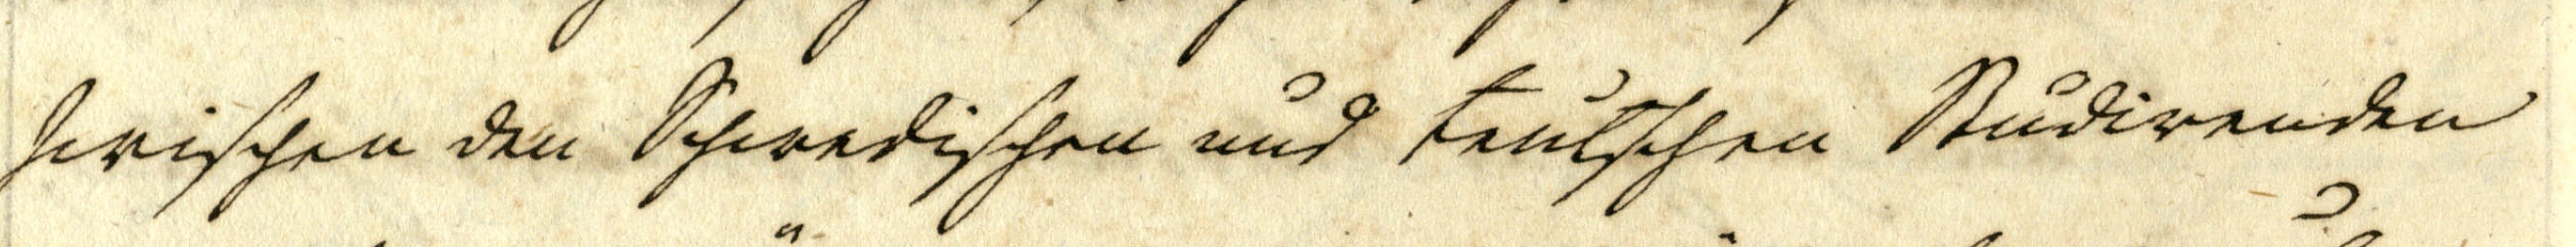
zwischen den Schwedischen und teutschen Studirenden
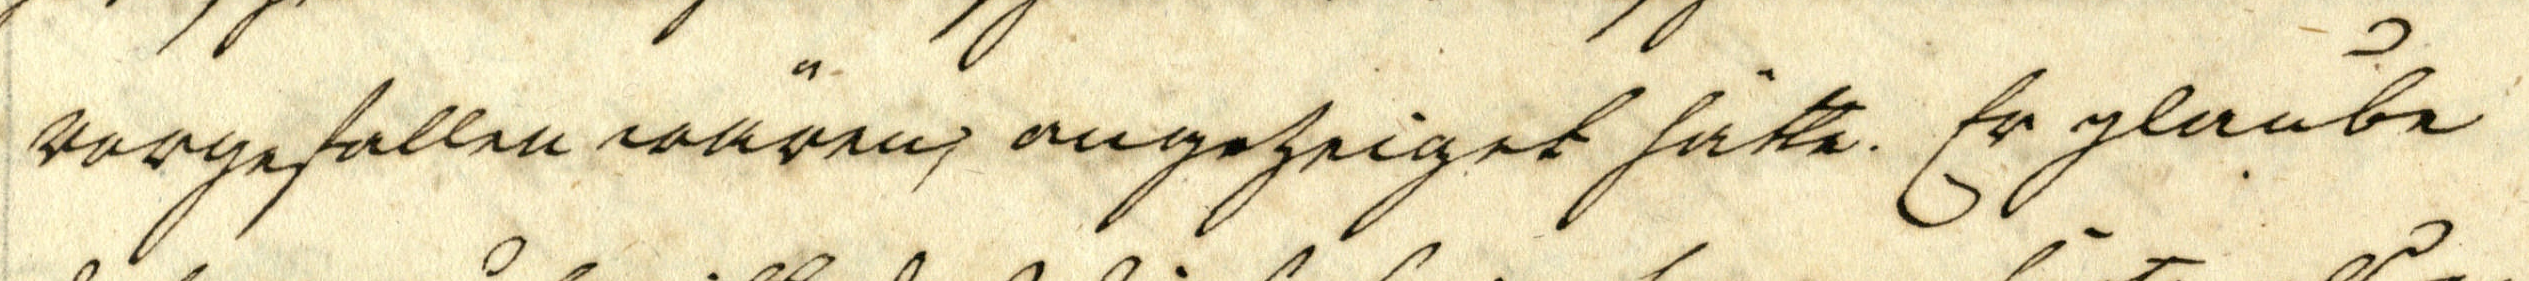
vorgefallen wären, angezeiget hätte. Er glaube
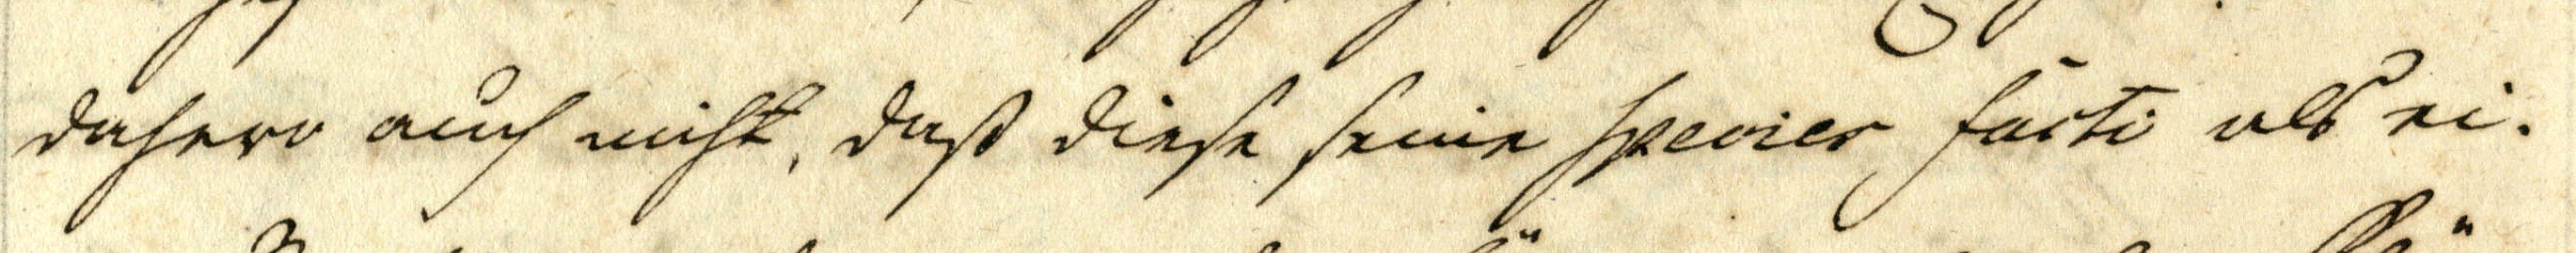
dahero auch nicht, daß diese seine species facti als ei¬
